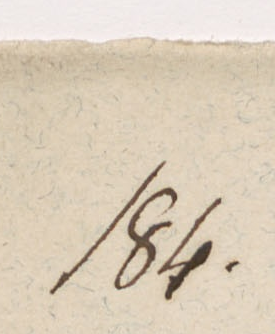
184.
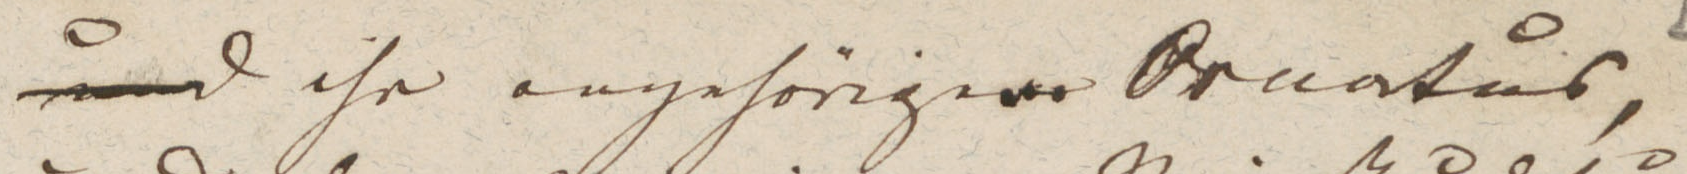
und ihr angehörigerm Ornatus,
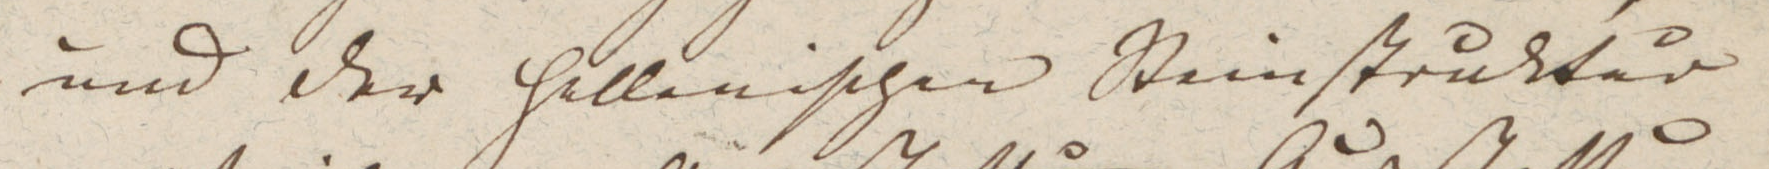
und der Hellenischen Steinstruktur
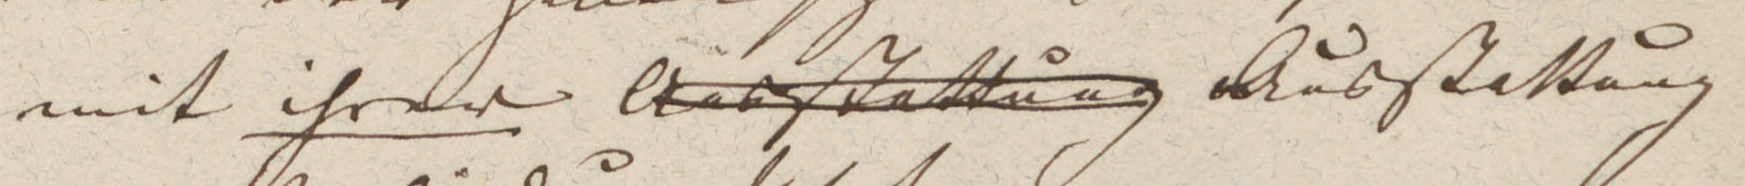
mit ihrer Ausstattung aAusstattung
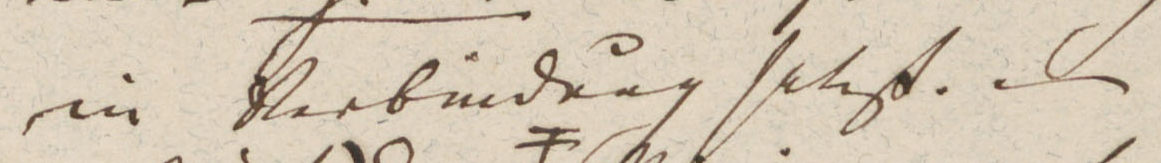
in Verbindung setzt. –
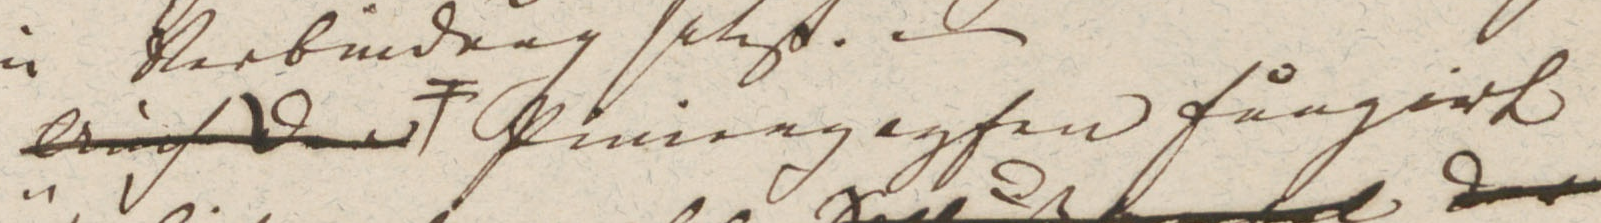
Auch dDer % Pinienzapfen fungirt
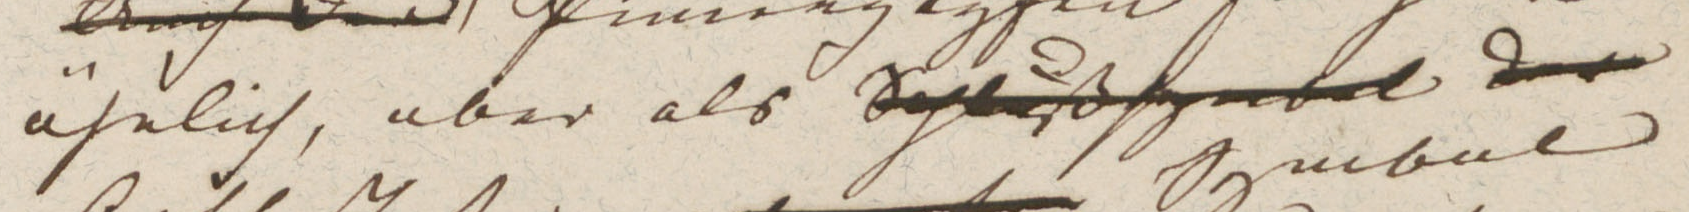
ähnlich, aber als Schlusssymbol der
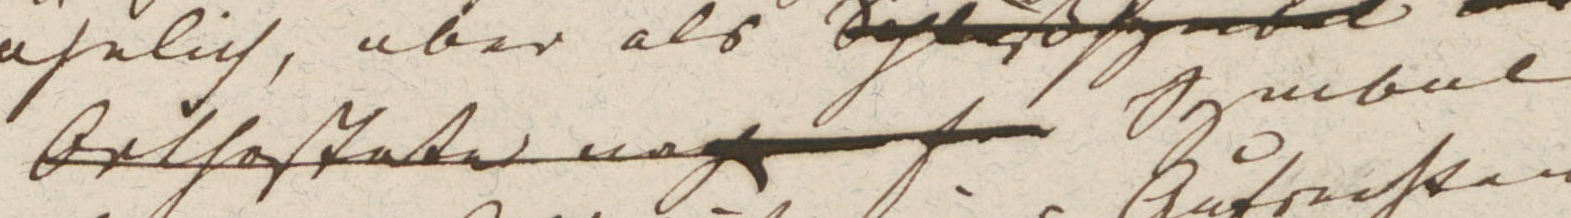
Orthostate nach f Symbol
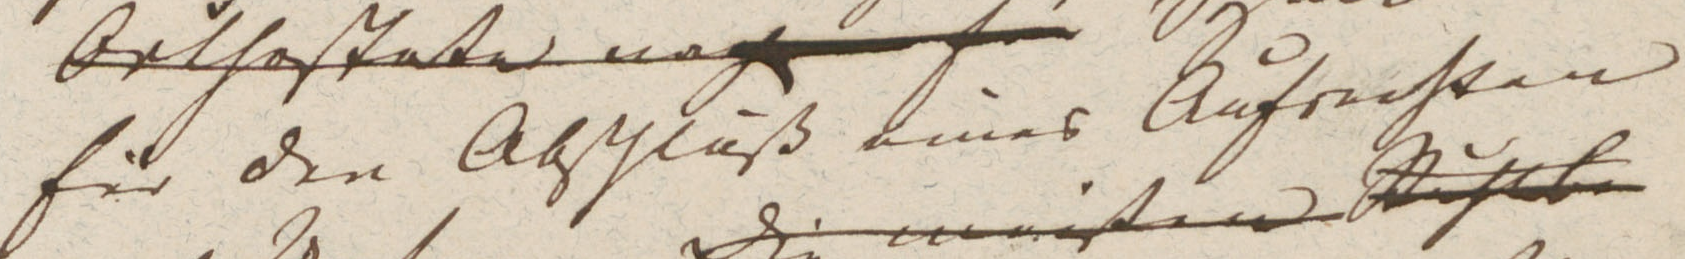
für den Abschluss eines Aufrechten
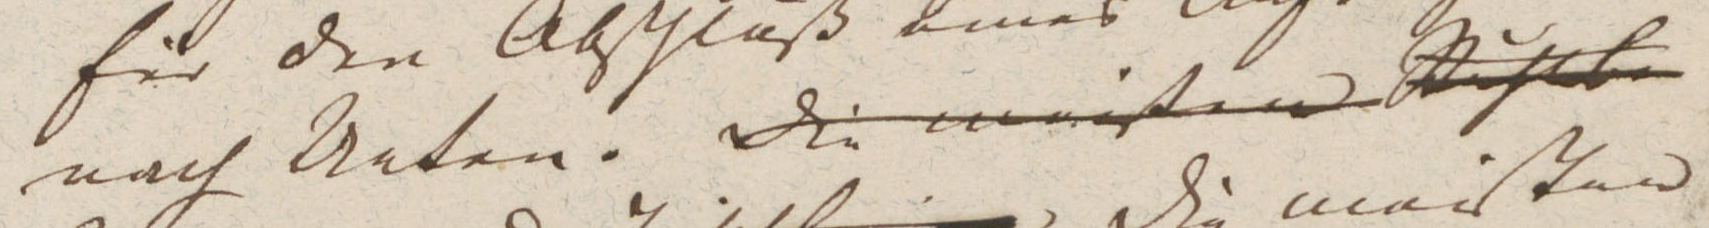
nach Unten. Die meisten Stuhlbe
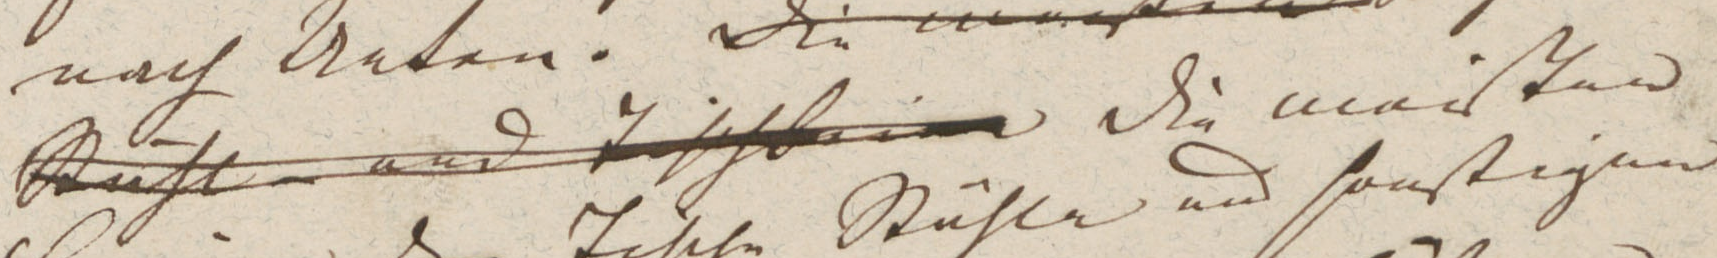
Stuhl- und Tischbeine Die meisten
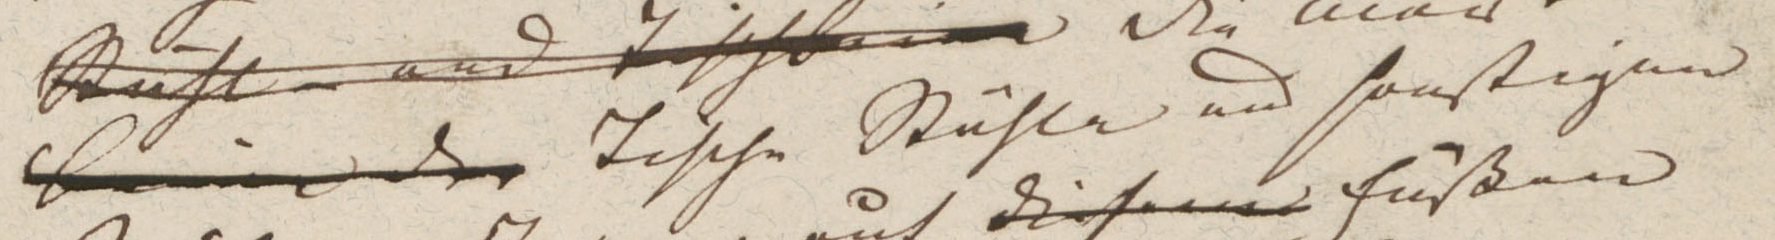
Beine der Tische Stühle und sonstigen
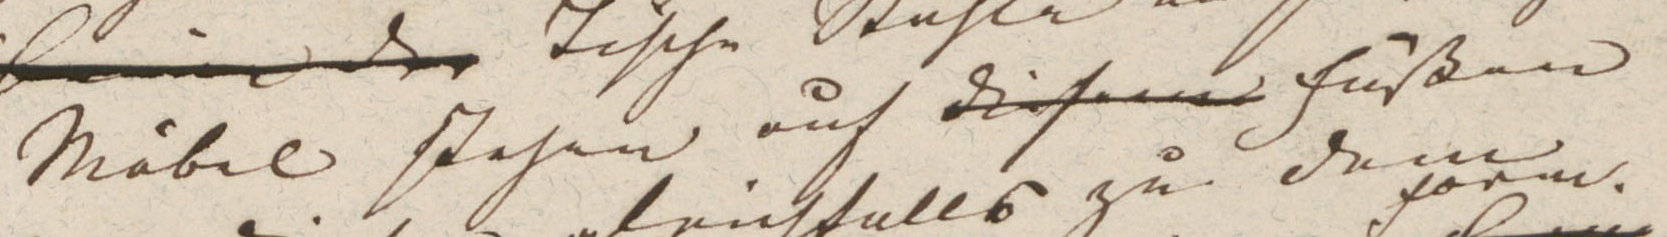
Möbel stehen auf diesem Füssen
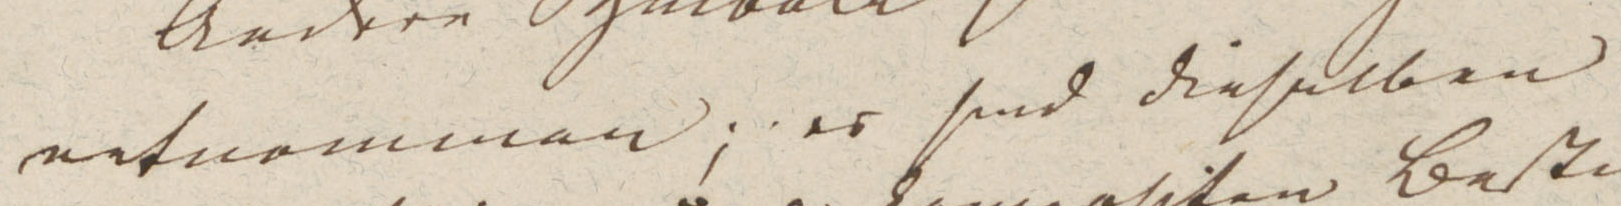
entnommen; es sind dieselben
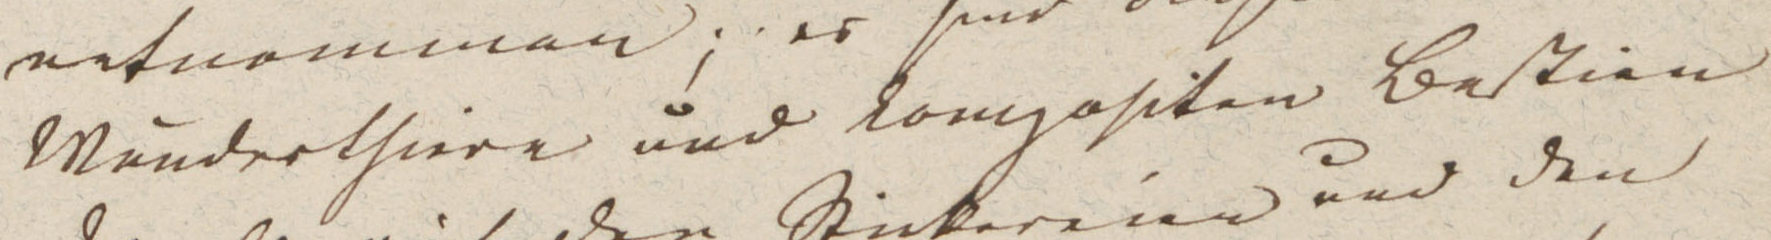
Wunderthiere und kompositen Bestien
